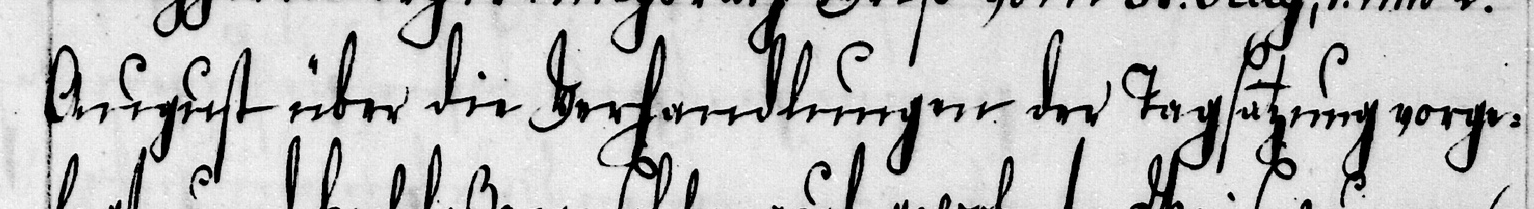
August über die Verhandlungen der Tagsatzung vorge¬
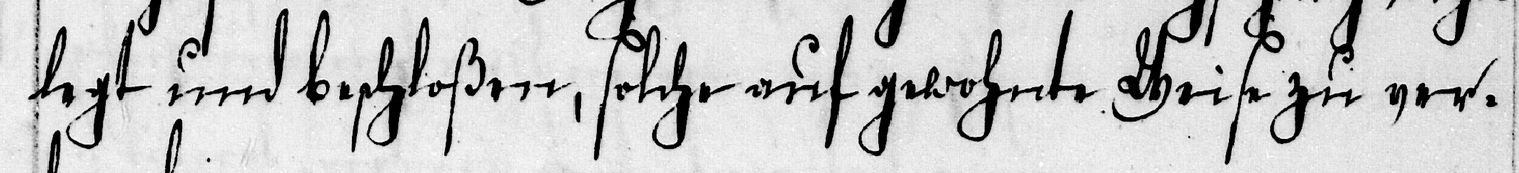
legt und beschloßen, solche auf gewohnte Weise zu ver¬
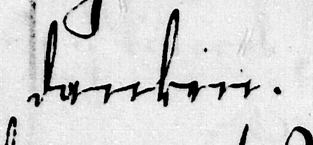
danken.
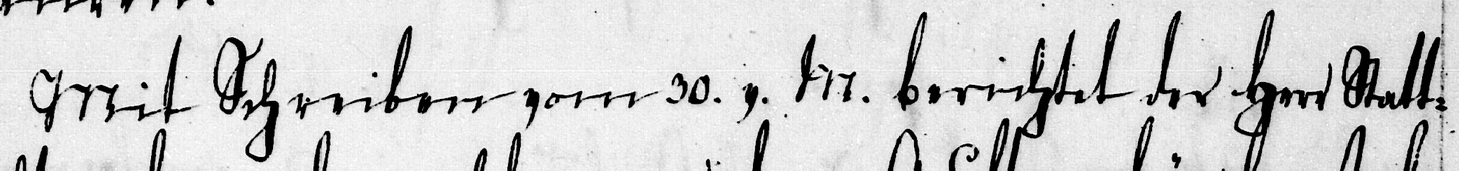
Mit Schreiben vom 30. v. M. berichtet der Herr Statt¬
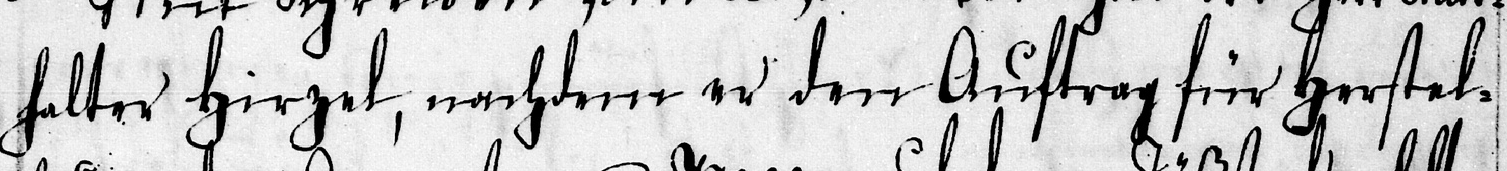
halter Hirzel, nachdem er den Auftrag für Herstel¬
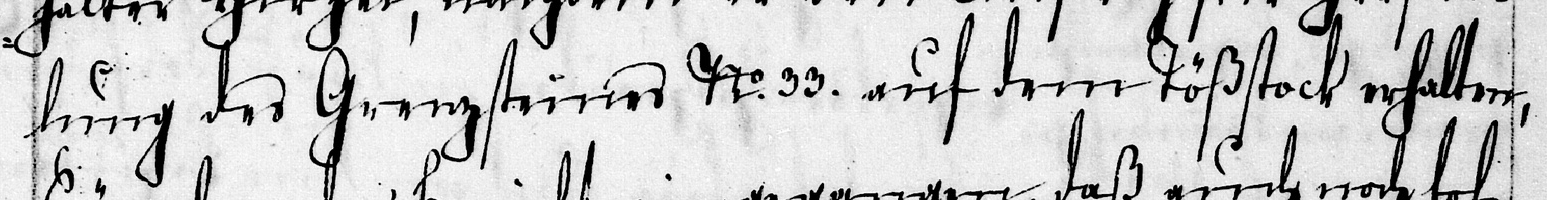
lung des Grenzsteines No. 33. auf dem Tößstock erhalten,
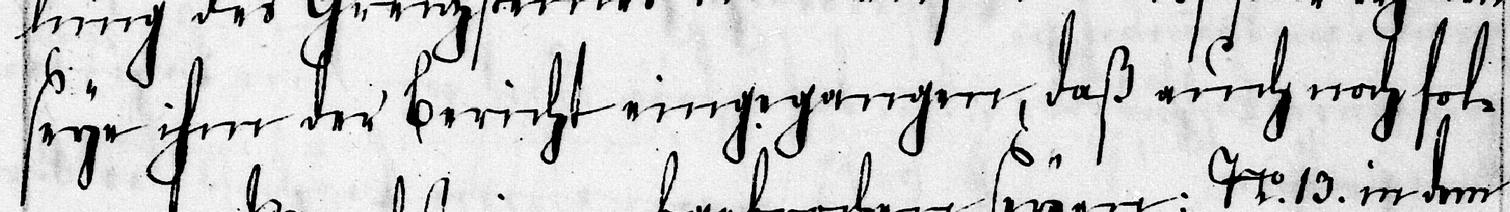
seye ihm der Bericht eingegangen, daß auch noch fol¬
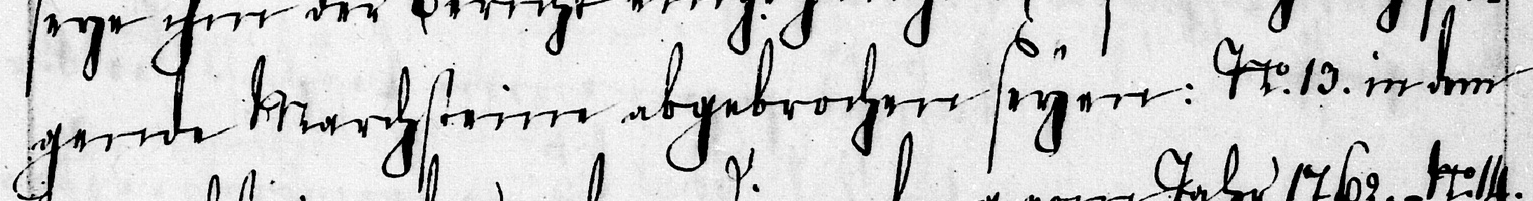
gende Marchsteine abgebrochen seyen: No. 13. in dem
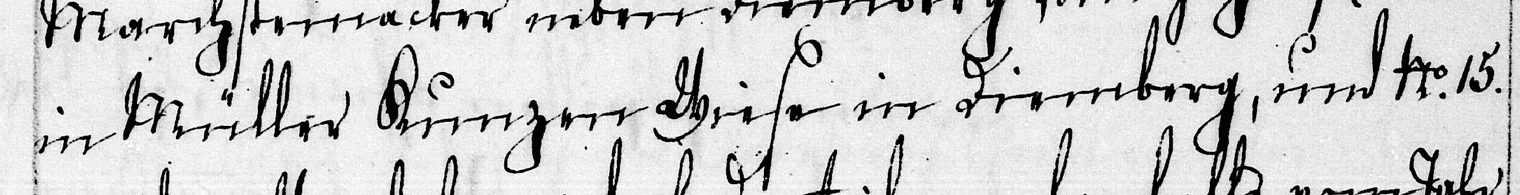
in Müller Kunzen Wiese in Diemberg, und No. 15.
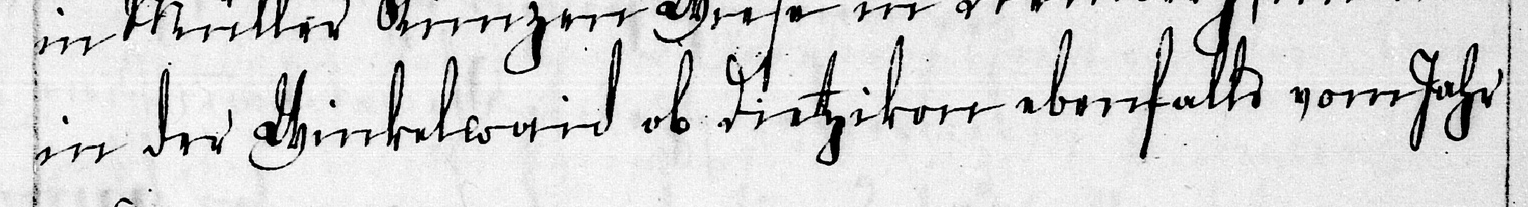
in der Winkelwaid ab Dietzikon ebenfalls vom Jahre
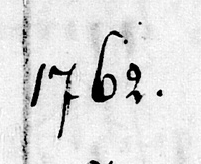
1762.
